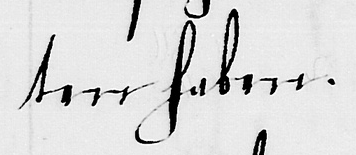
ten haben.
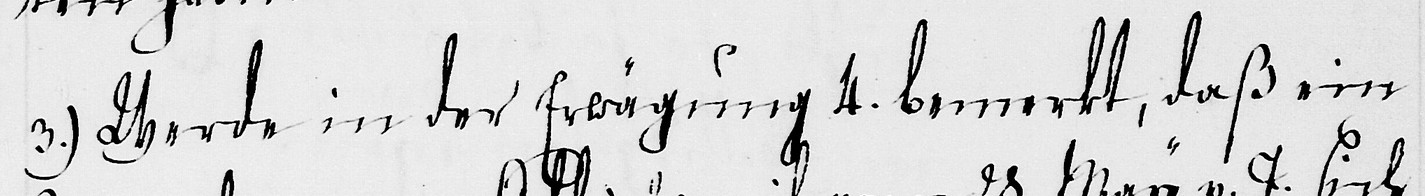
3.) Werde in der Erwägung 4. bemerkt, daß ein
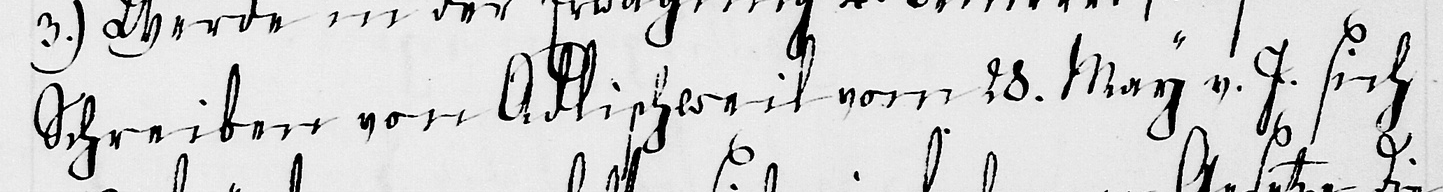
Schreiben von Adlischweil vom 28. März v. J. sich
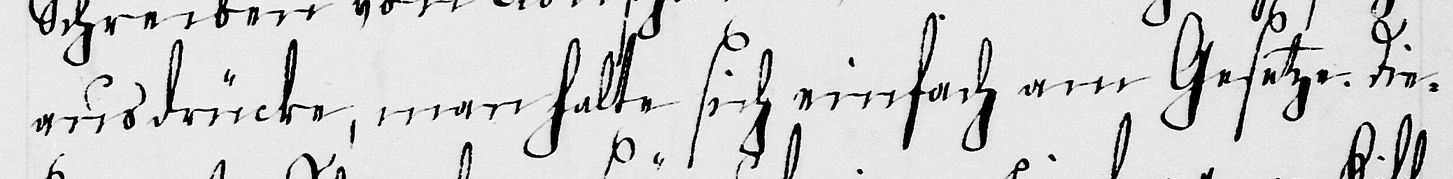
ausdrücke, man halte sich einfach am Gesetze. Di¬
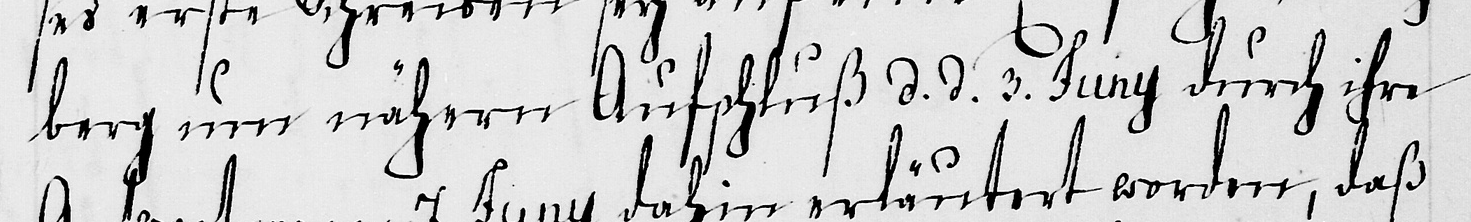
berg um nähern Aufschluß d. d. 3. Juny durch ihre
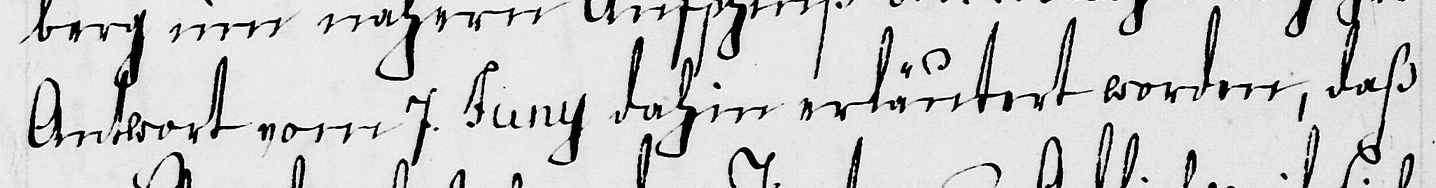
Antwort vom 7. Juny dahin erläutert worden, daß
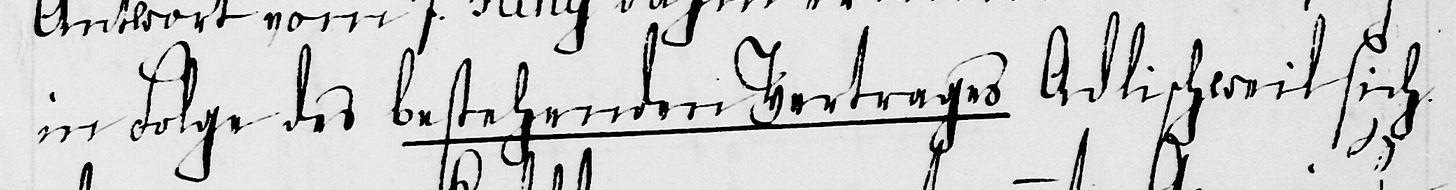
in Folge des bestehenden Vertrages Adlischweil sich
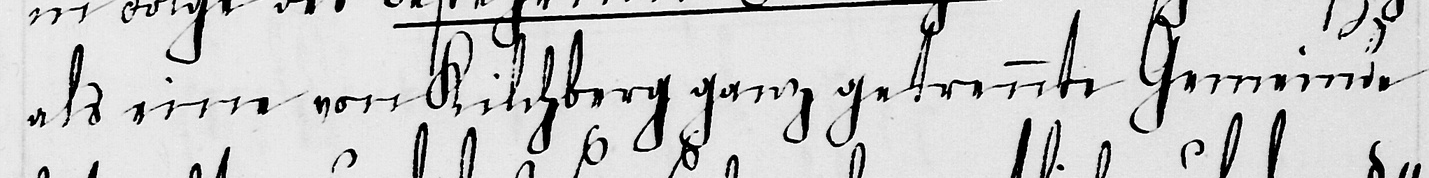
als eine von Kilchberg ganz getrennte Gemeinde
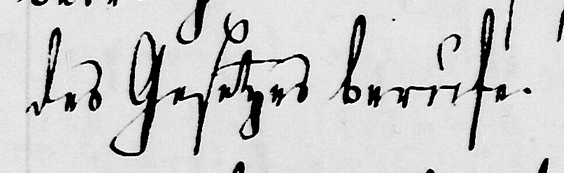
des Gesetzes berufe.
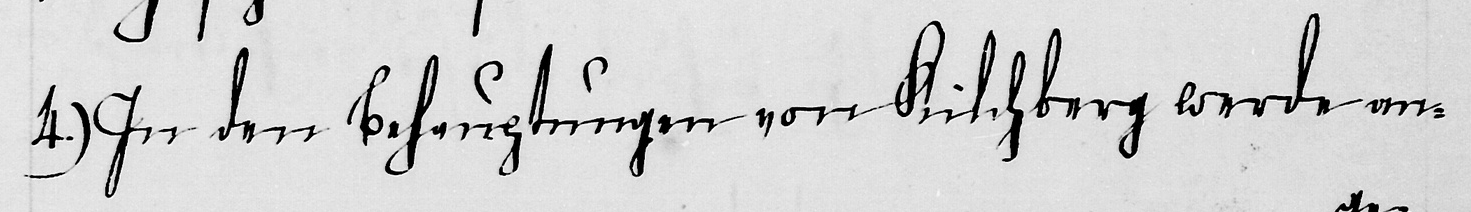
4.) In den Behauptungen von Kilchberg werde an-
